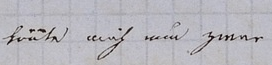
könnte mich nun zwar
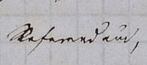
Referendum,
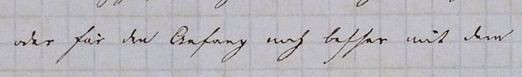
oder für den Anfang noch besser mit dem
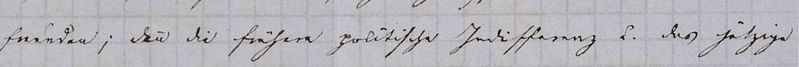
freunden; denn die frühere politische Indifferenz u. das jetzige
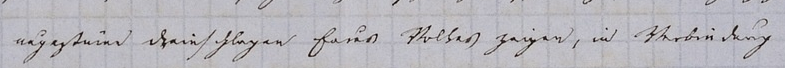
ungestüme Dreinschlagen Eures Volkes zeigen, in Verbindung
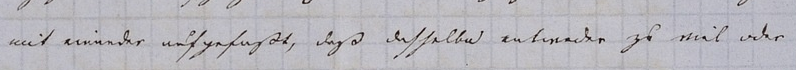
mit einander aufgefaßt, daß dasselbe entweder zu viel oder
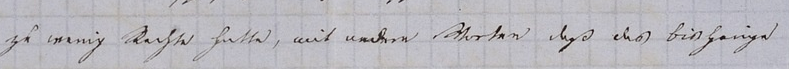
zu wenig Rechte hatte, mit andern Worten daß das bisherige
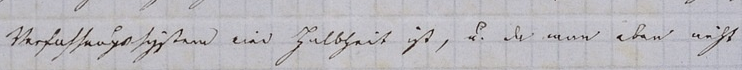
Verfassungssystem eine Halbheit ist, u. da man eben nicht
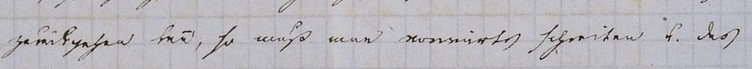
zurückgehen kann, so muß man vorwärts schreiten u. das
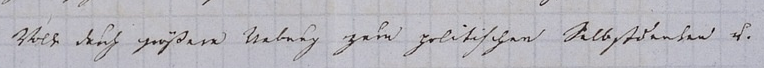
Volk durch größere Uebung zum politischen Selbstdenken u.
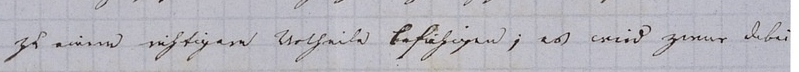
zu einem richtigen Urtheile befähigen; es wird zwar dabei
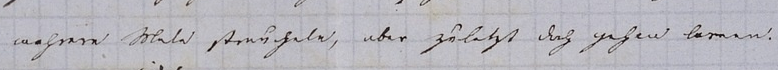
mehrere Male straucheln, aber zuletzt doch gehen lernen.
